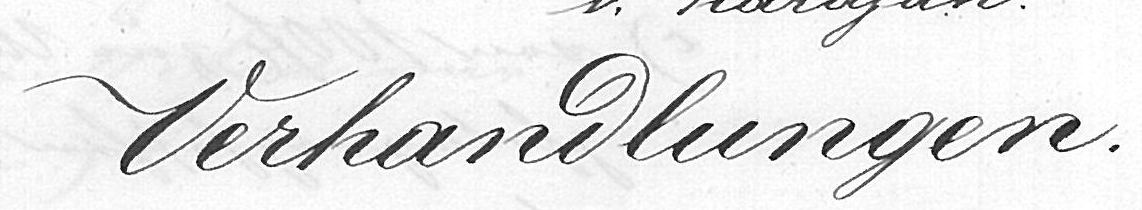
Verhandlungen
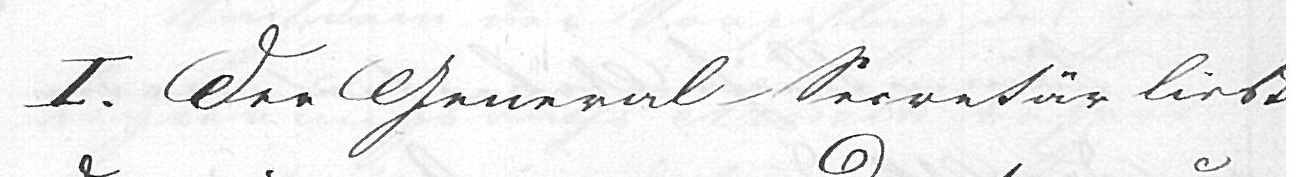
I. Der General-Secretär liest
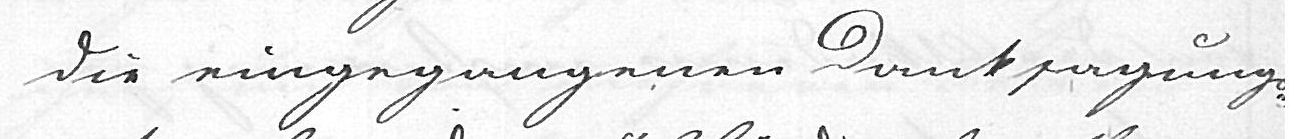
die eingegangenen Danksagungs-
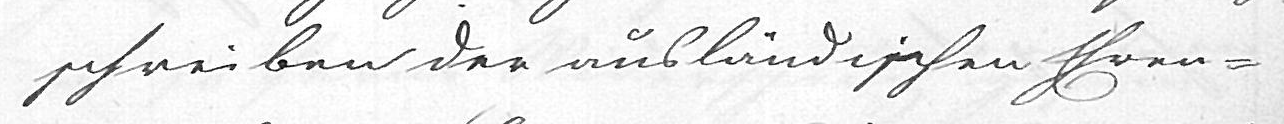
schreiben der ausländischen Ehren-
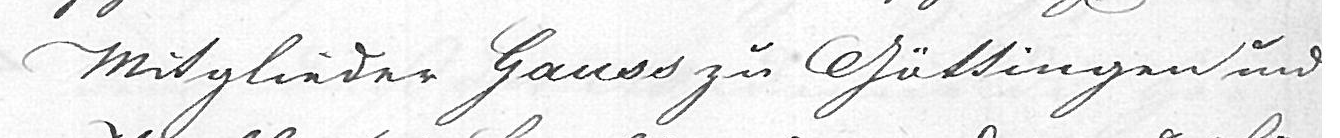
Mitglieder Gauss zu Göttingen und
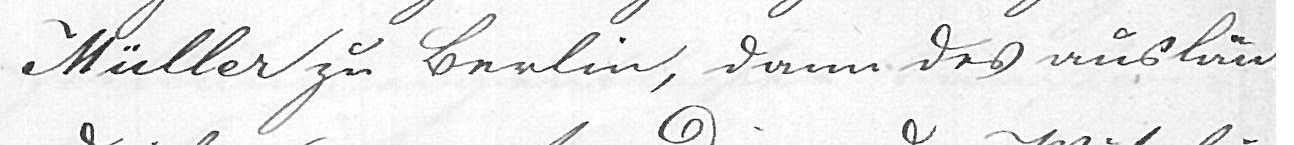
Müller zu Berlin, dann des auslän-
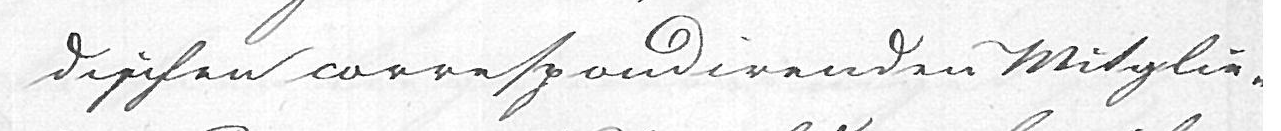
gischen correspondirenden Mitglie-
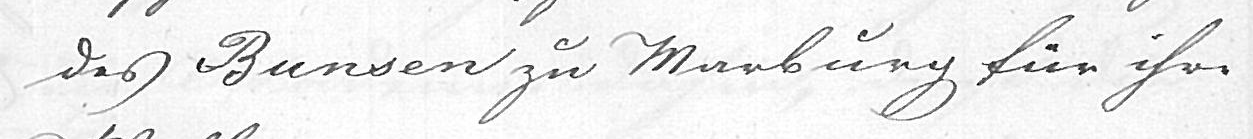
des Bunsen zu Marburg für ihre
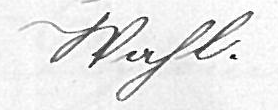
Wahl.
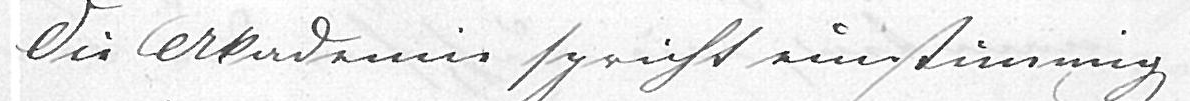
Die Akademie spricht einstimmig
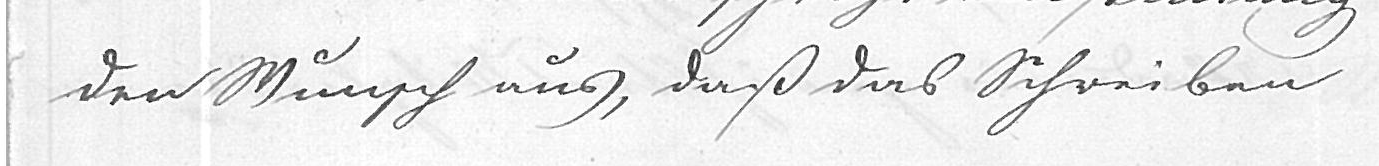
den Wunsch aus, daß das Schreiben
